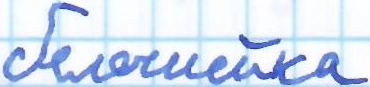белошейка
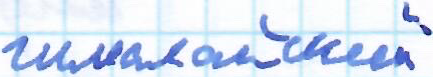гималайский
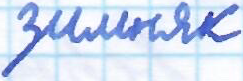зимняк
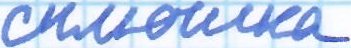сплюшка
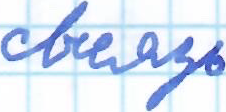свиязь
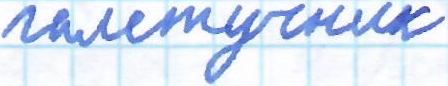галстучник
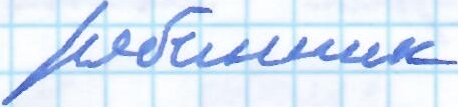рябинник
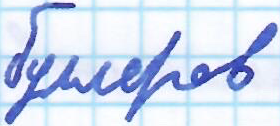буллеров
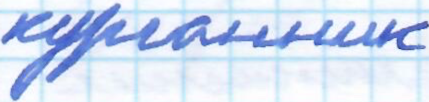курганник
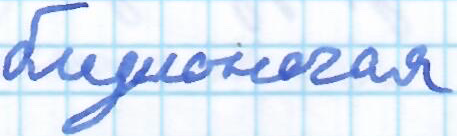бледноногая
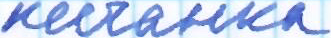песчанка
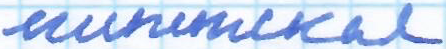египетская
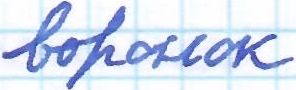воронок
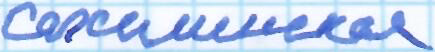сахалинская
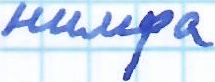нимфа
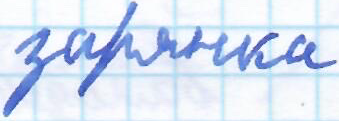зарянка
